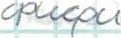фифи
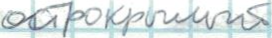острокрылый
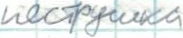пеструшка
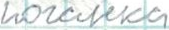поганка
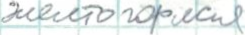желтогорлая
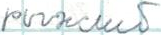рыжий
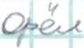орёл
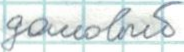домовый
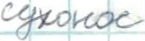сухонос
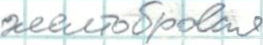желтобровая
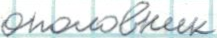ополовник
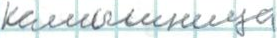камышница
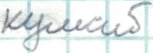кумай
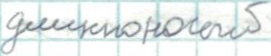длинноносый
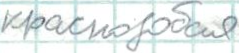краснозобая
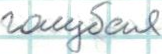голубая
